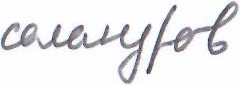соландров
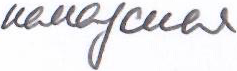канадская
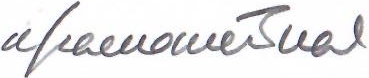красношейная
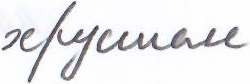хрустан
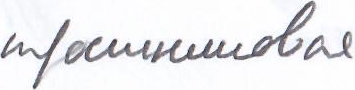тростниковая
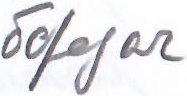бородач
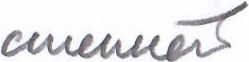степной
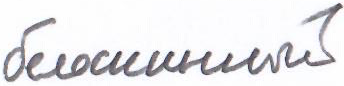белоспинный
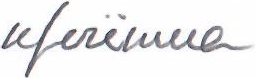кречётка
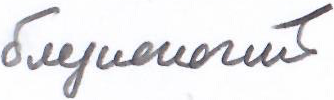бледноногий
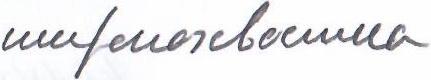широкохвостка
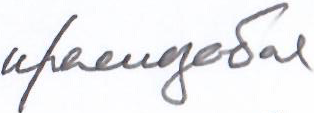краснозобая
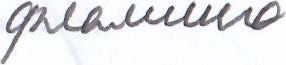фламинго
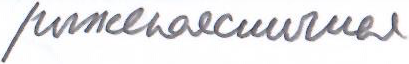рыжепоясничная
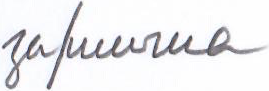зарничка
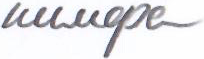нимфа
